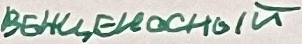венценосный
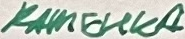каменка
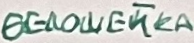белошейка
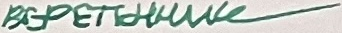веретенник
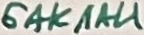баклан
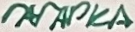гагарка
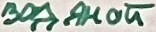водяной
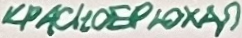краснобрюхая
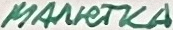малютка
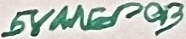буллеров
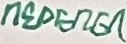перепел
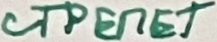стрепет
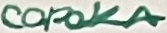сорока
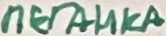пеганка
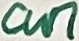сип
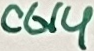сыч
